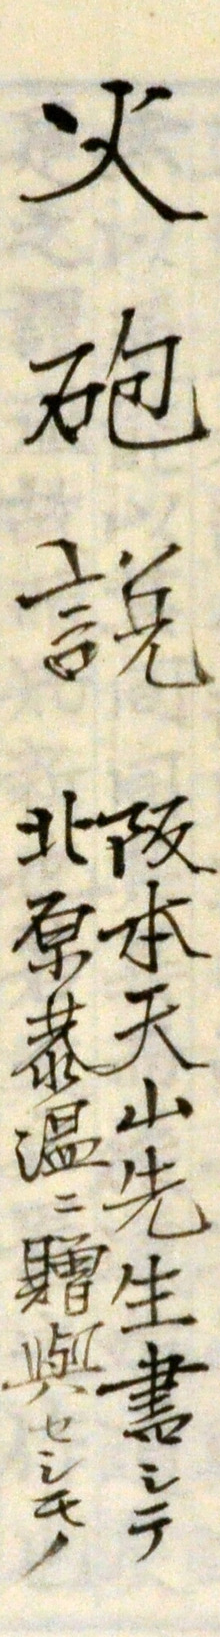火砲説阪本天山先生書シテ
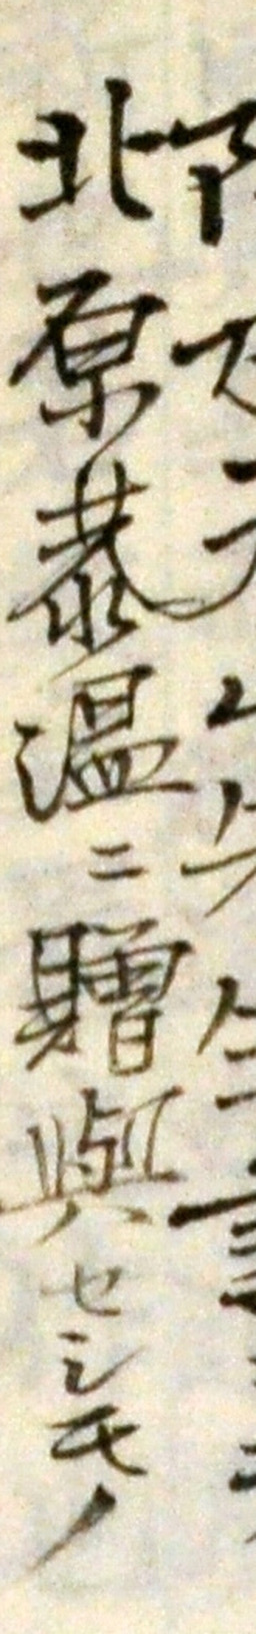北原恭温ニ贈与セシモノ
